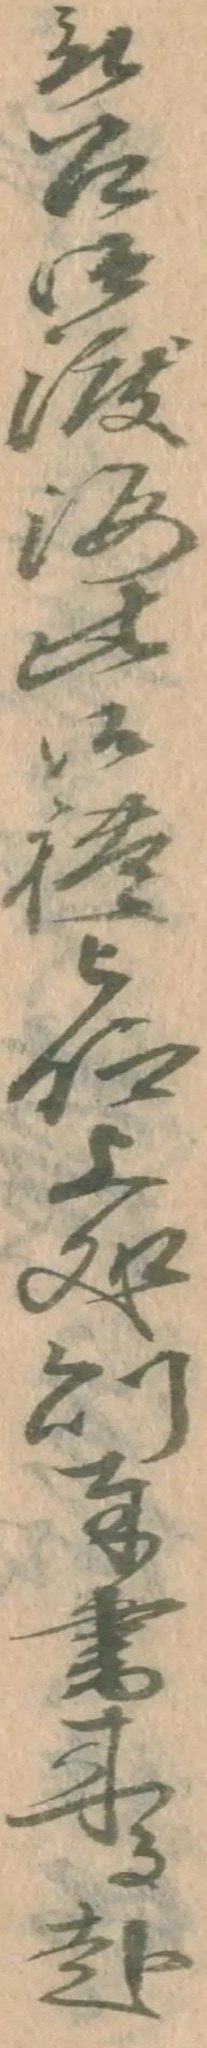被召御渡海此御礼被仰上処則奉書来る赴
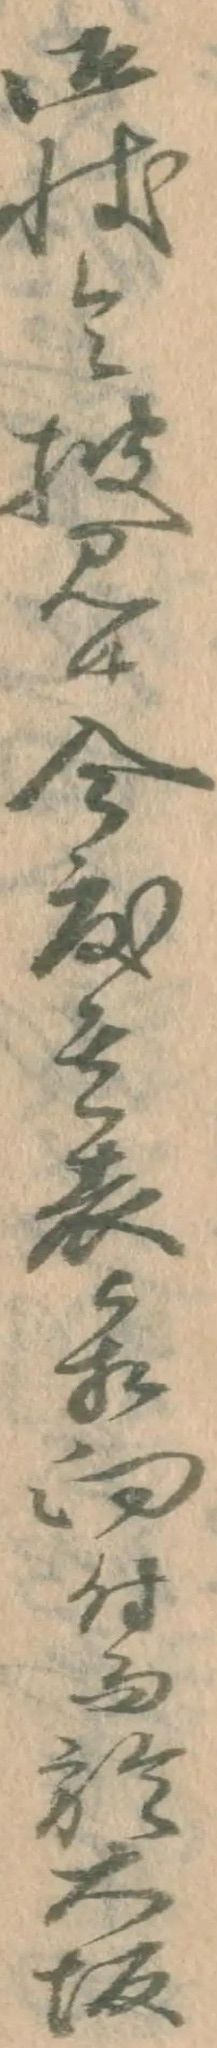御状令披見候今度其表被相向付事於大坂
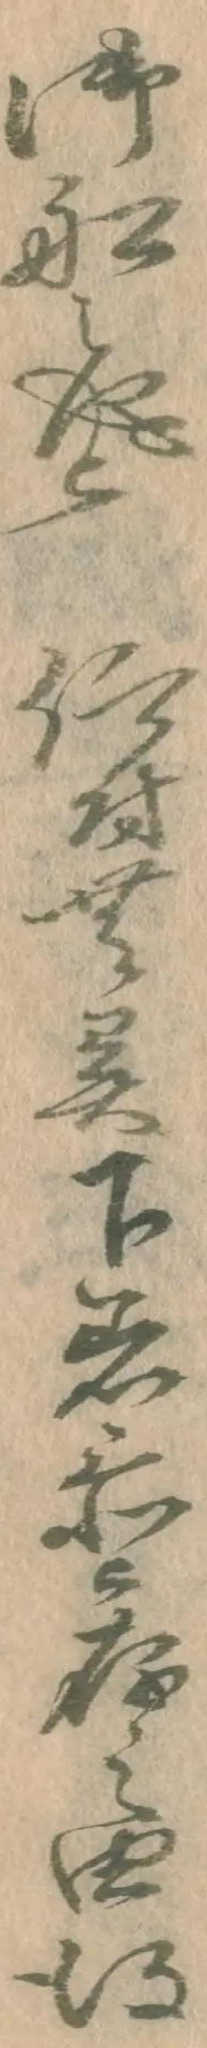御舩之儀被仰付無異下着悉被存之由得
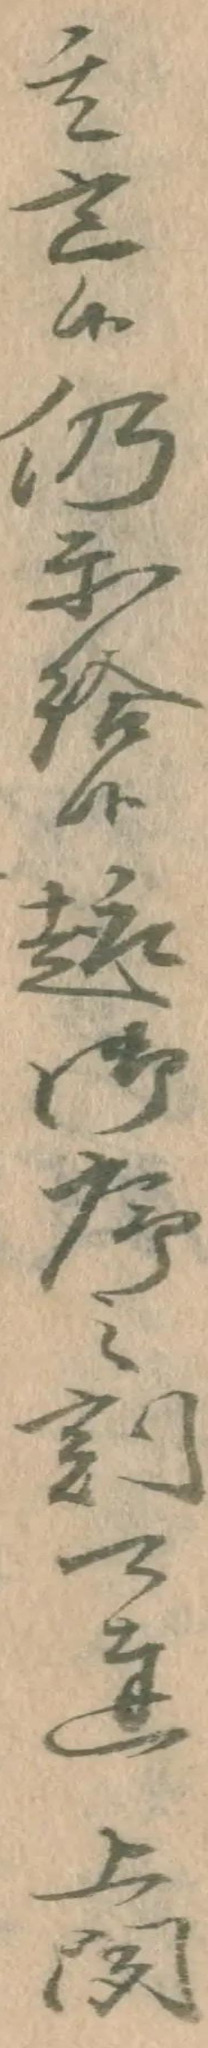其意候仍悉給候趣御序之刻可達上聞
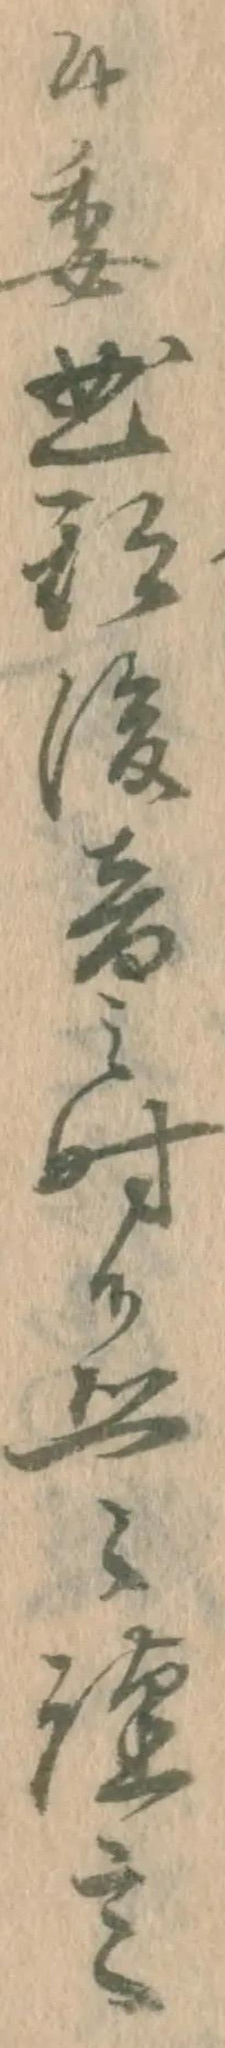候委曲程後音之時候恐々謹言
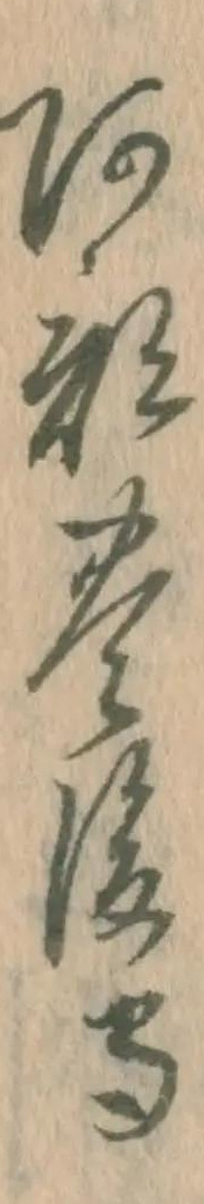阿部豊後守
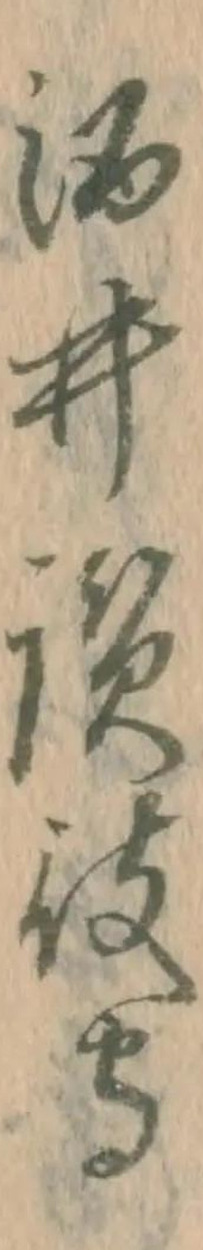酒井讃岐守
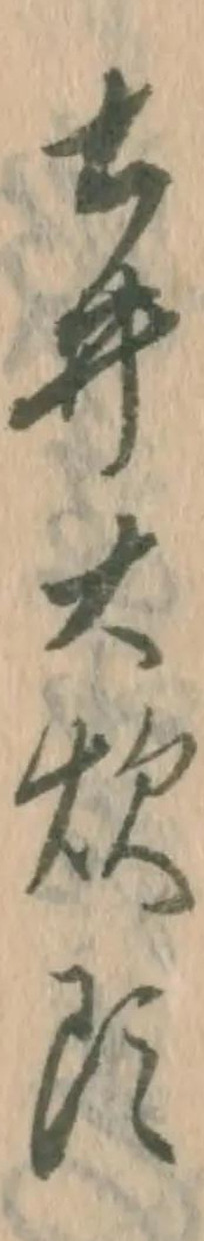土井大炊頭
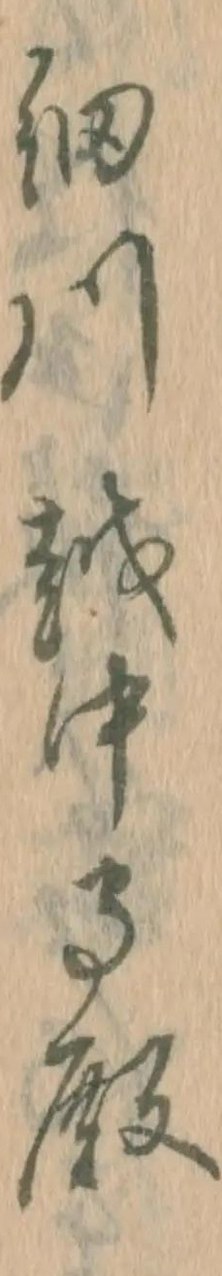細川越中守殿
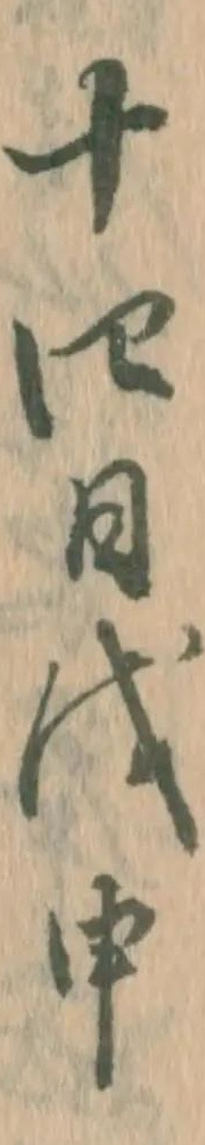十四日戊申
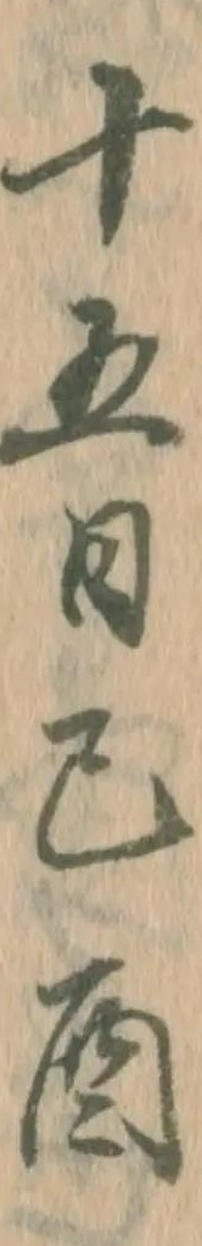十五日己酉
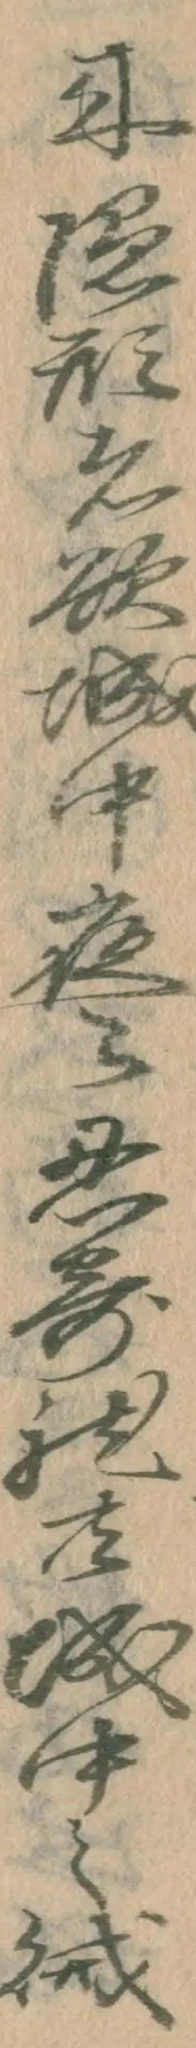来隠形者欲城中夜に忍寄然共城中之賊
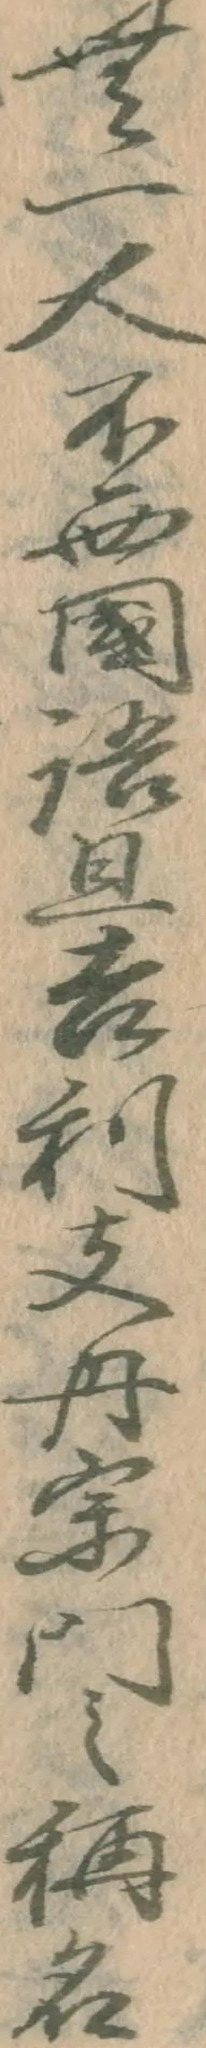無一人不西国語且吉利支丹宗門之稱名
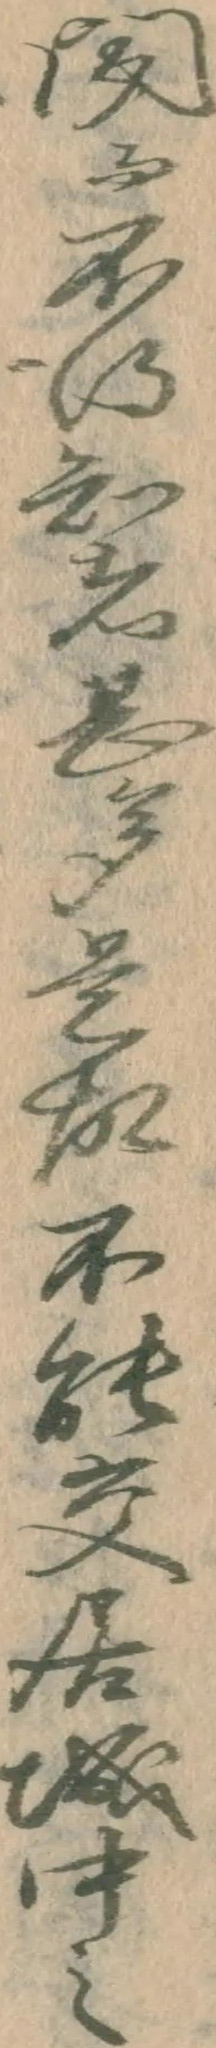聞而不得知者甚多是故不能交居城中之
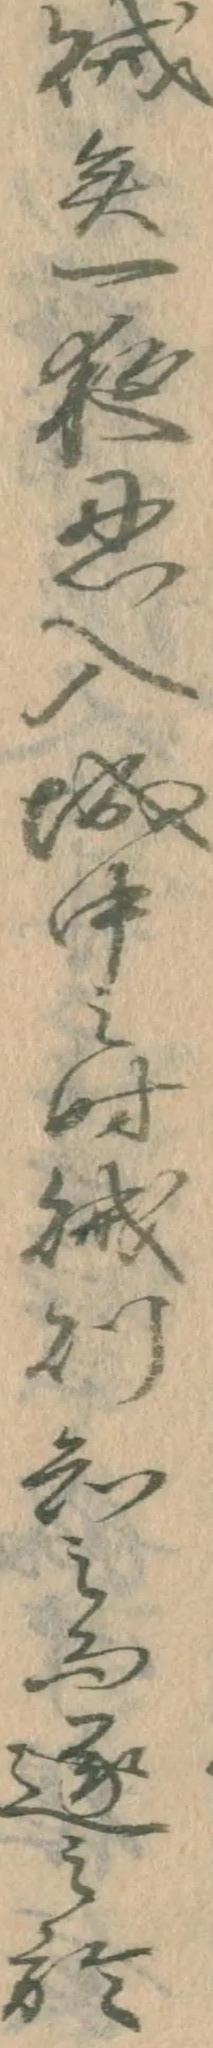賊矣一夜忍入城中之時賊則知之而遂之於
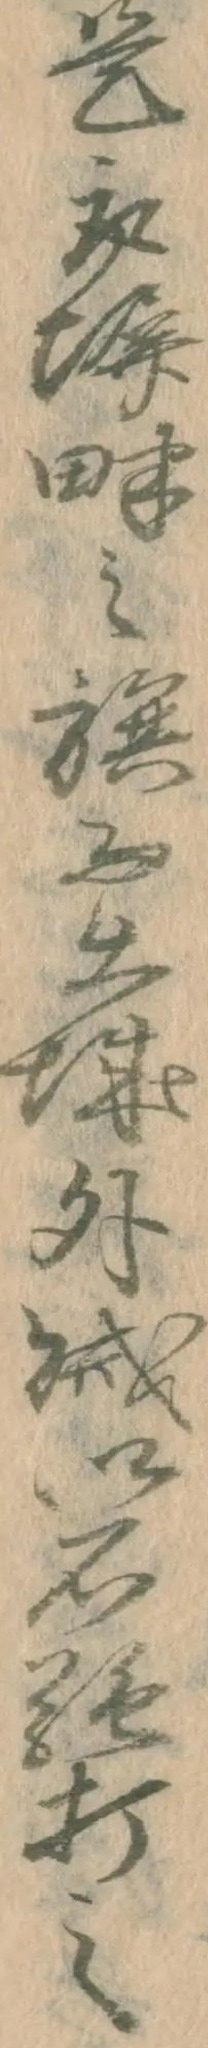是取塀畔之旗而出城外賊以石強打之
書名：切支丹御退治記 49巻. [6]
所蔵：国立国会図書館 National Diet Library, JAPAN
